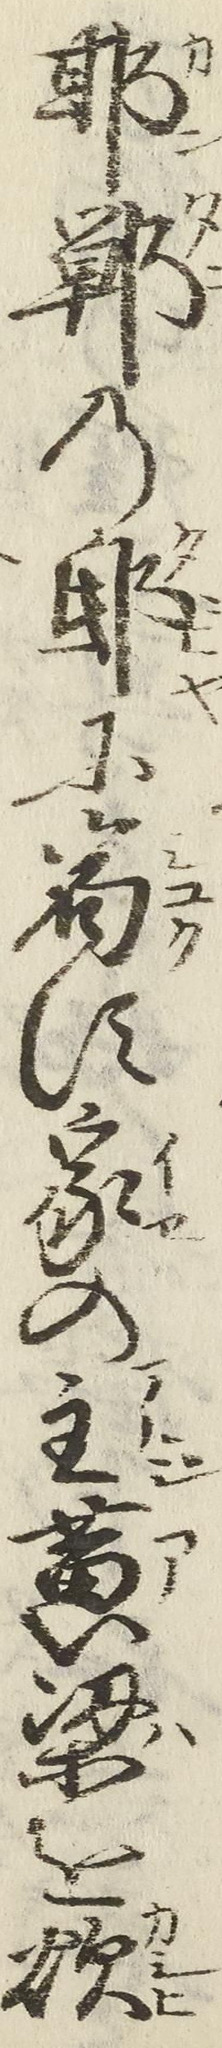邯鄲の邸に宿す家の主黄梁を炊
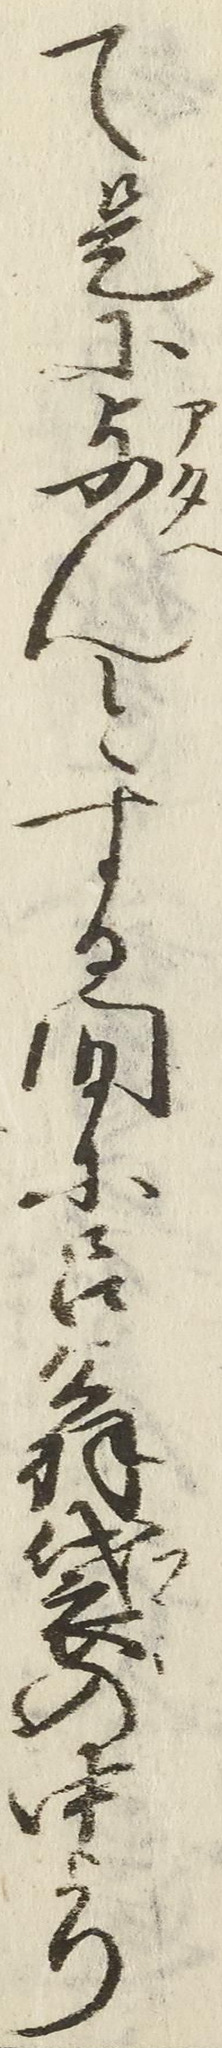て是に与んとする間に呂翁袋の中より
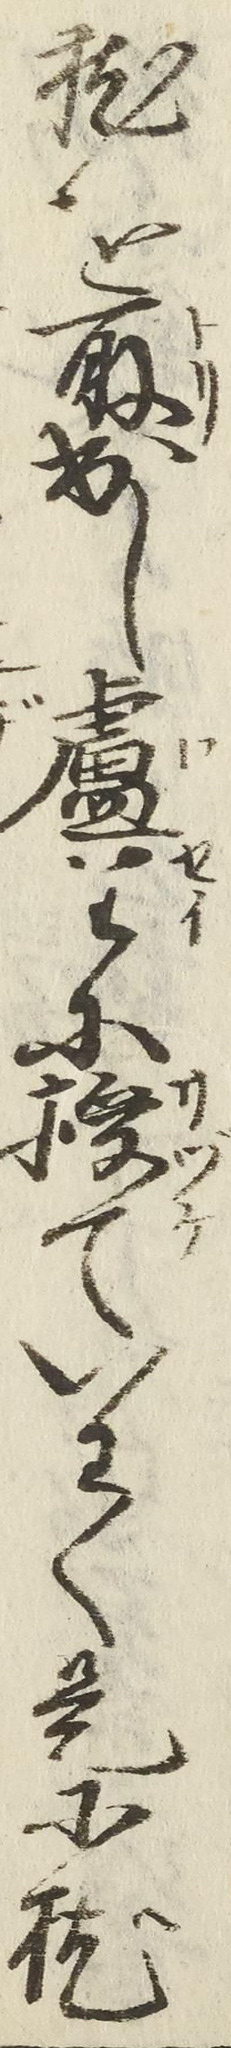枕を取出し廬生に授ていわく是に枕
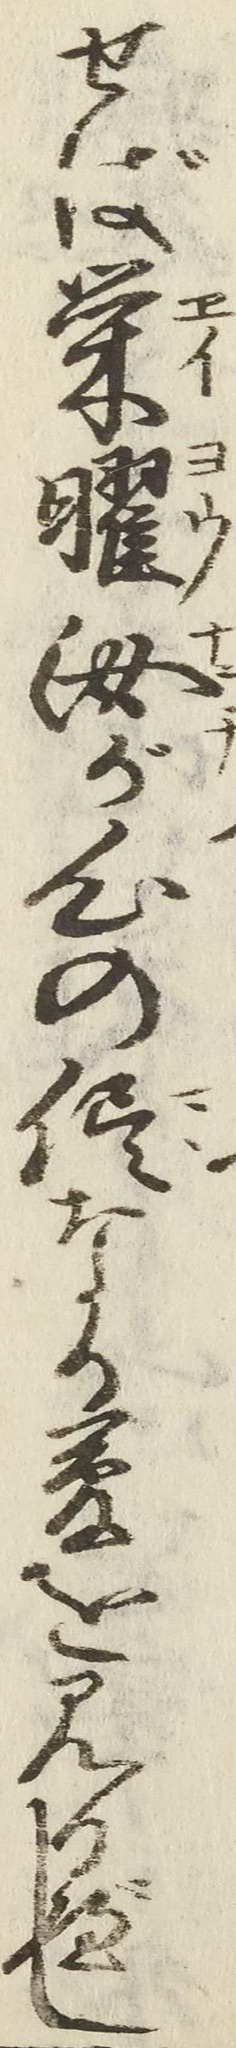せば栄耀汝が心の侭なる夢を見るべし
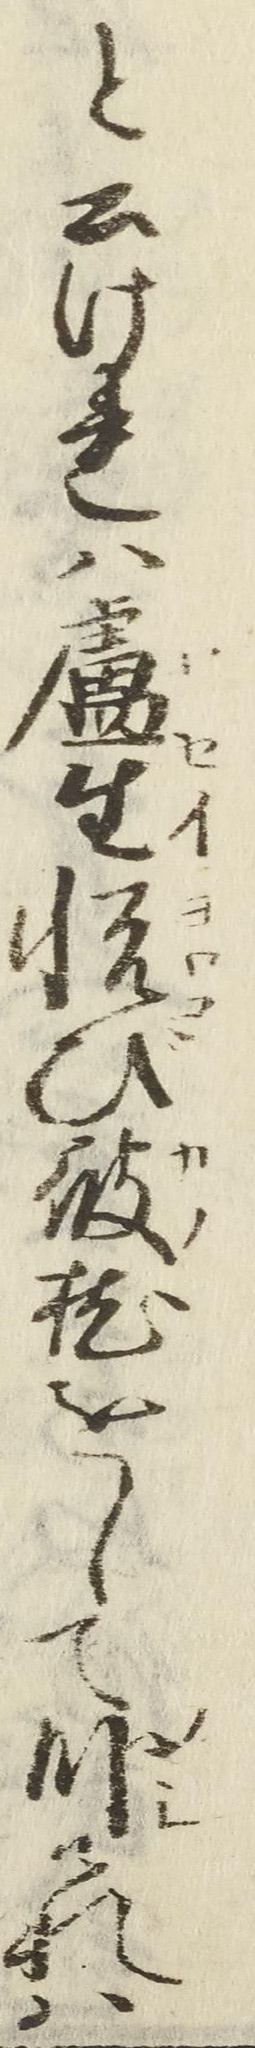と云けれは廬生悦び彼枕をして臥けれは
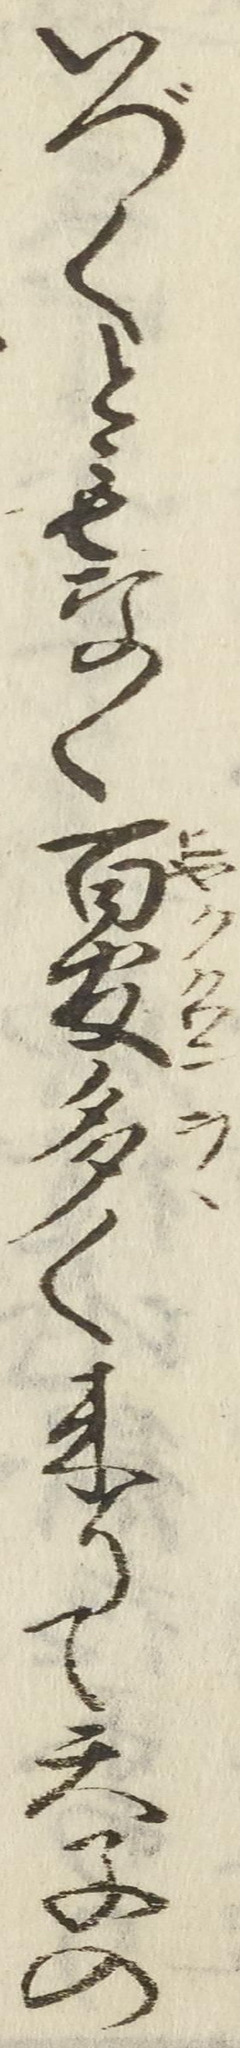いづくともなく百官多く来りて天子の
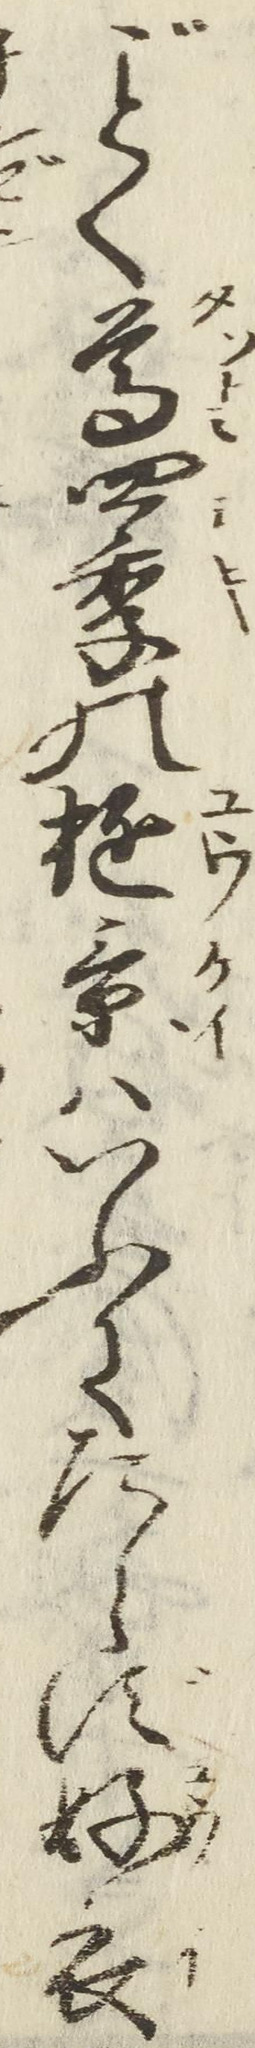ごとく尊四季の遊景はいふにたらず好衣
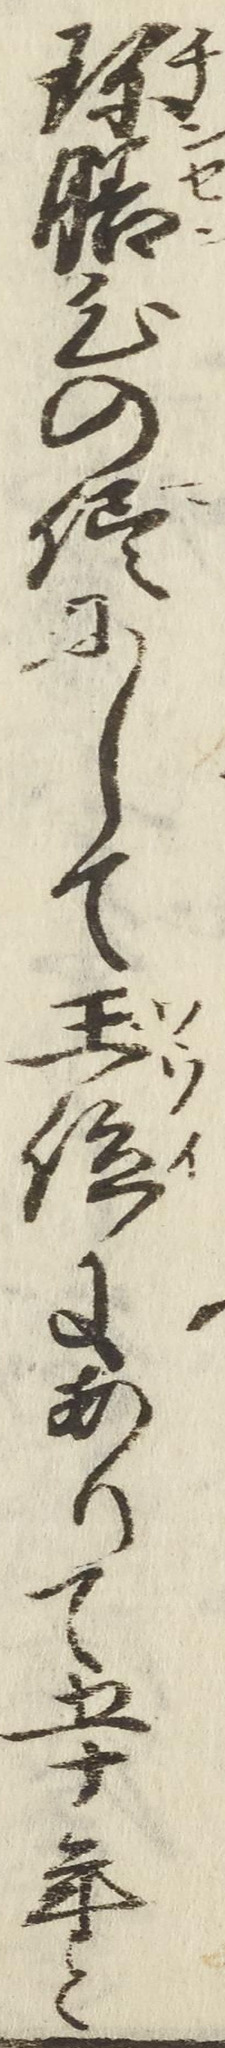珍膳心の侭にして王位にありて五十年と
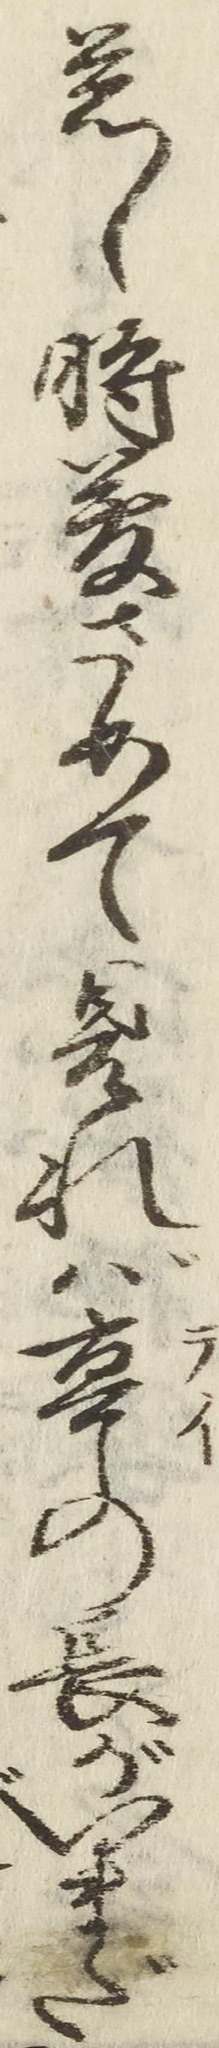覚し時夢さめて見れば亭の長がいまだ
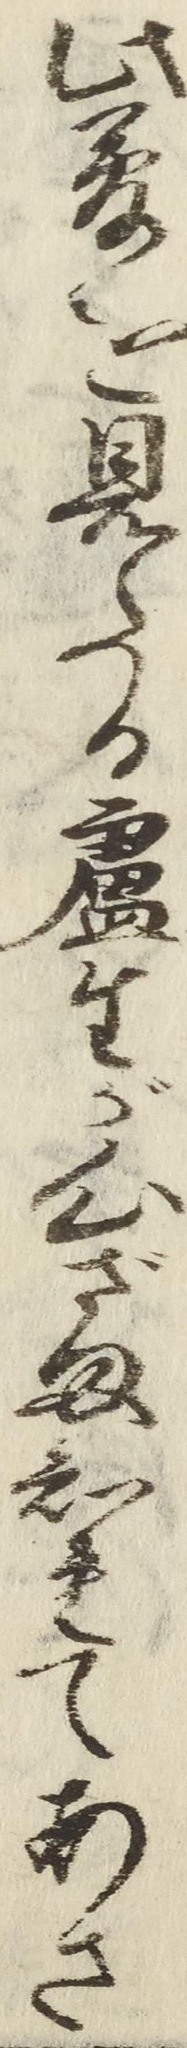此夢を見たる廬生が心ざま知れてあさ
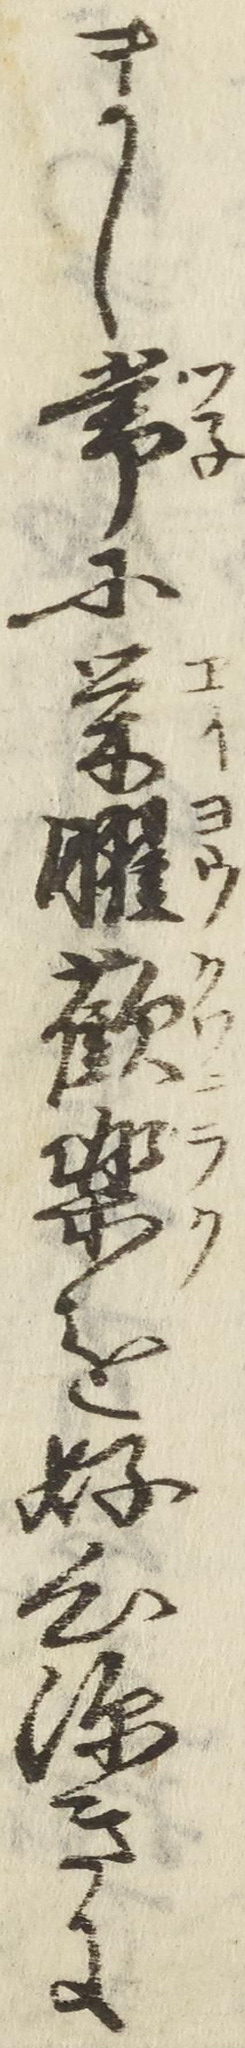まし常に栄耀歓楽を好心深きに

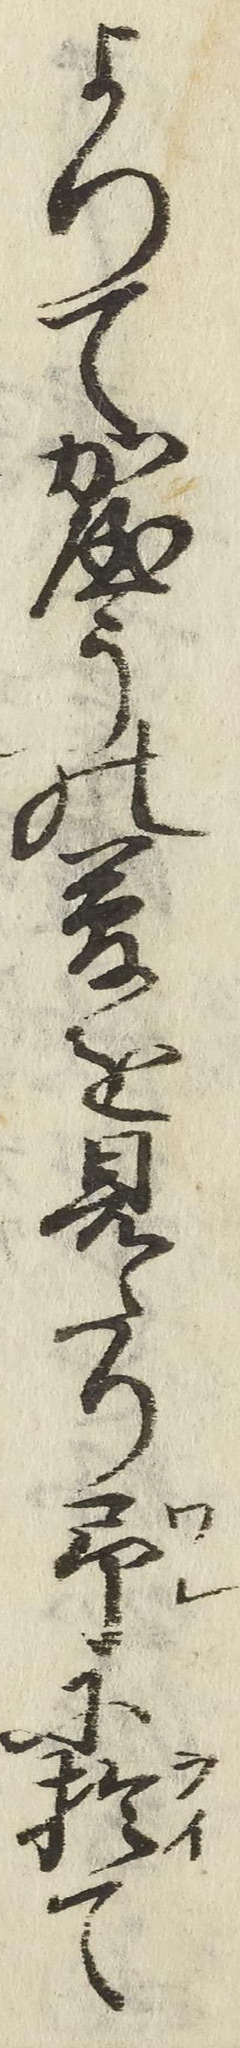よりてかやうの夢を見たり予に於て
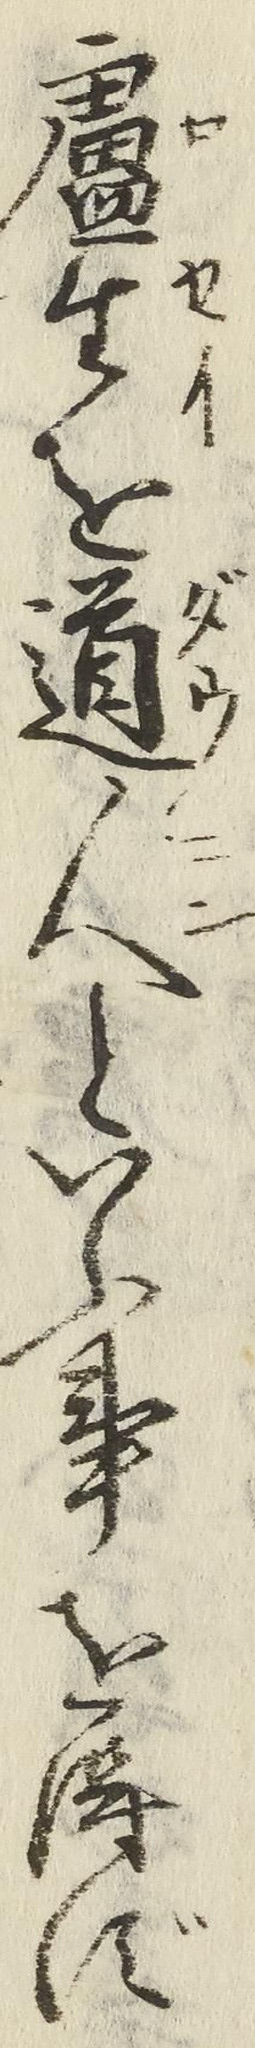廬生を道人といふ事を得ず
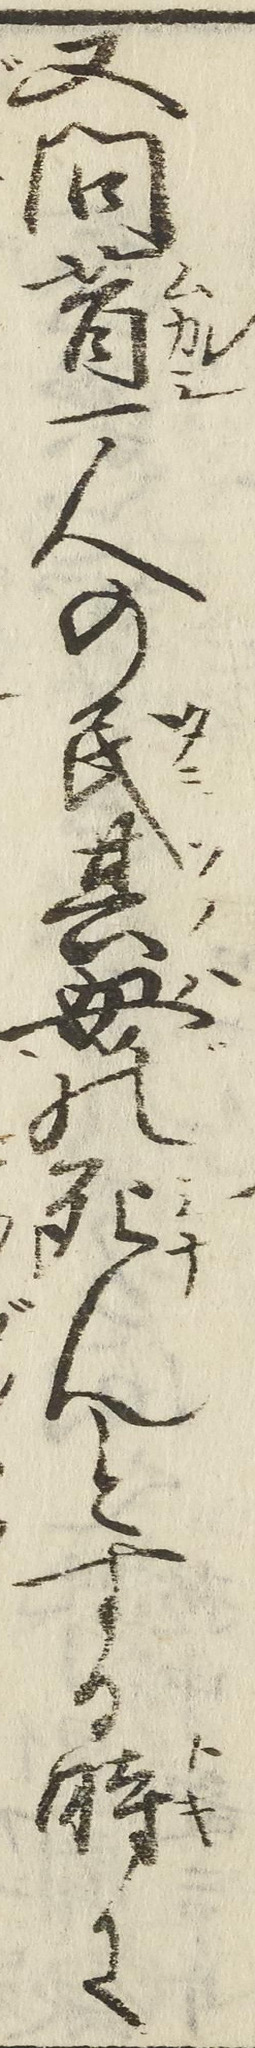又問昔一人の民其母の死んとする時に
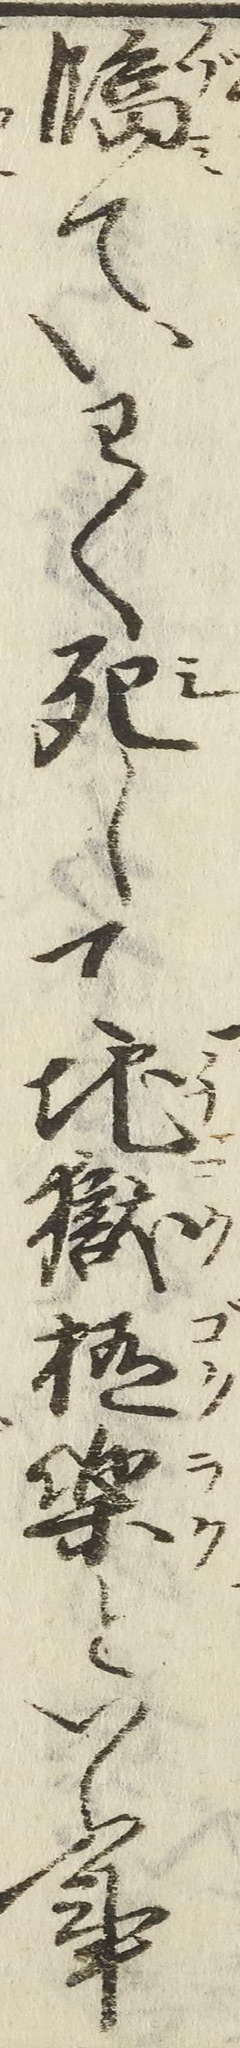臨ていわく死して地獄極楽といふ事
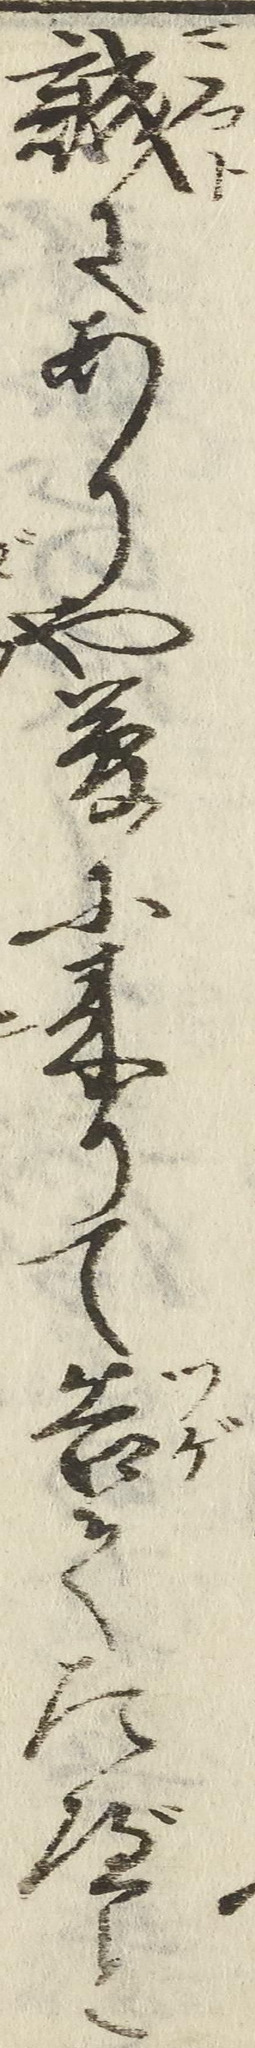誠にありや夢に来りて告てたべと
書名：天地或問珍　地
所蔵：東京大学地震研究所図書室 Earthquake Research Institute Library, The University of Tokyo, JAPAN
